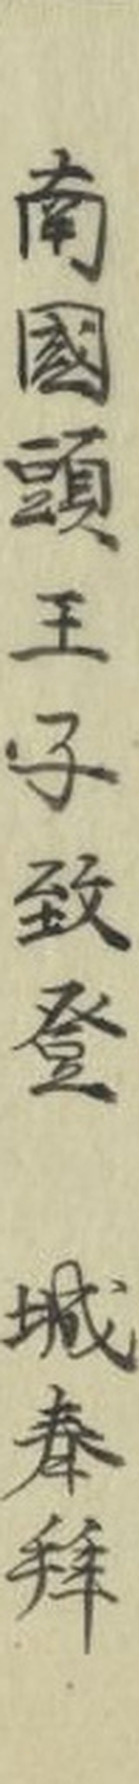南国頭王子到登城奉拝
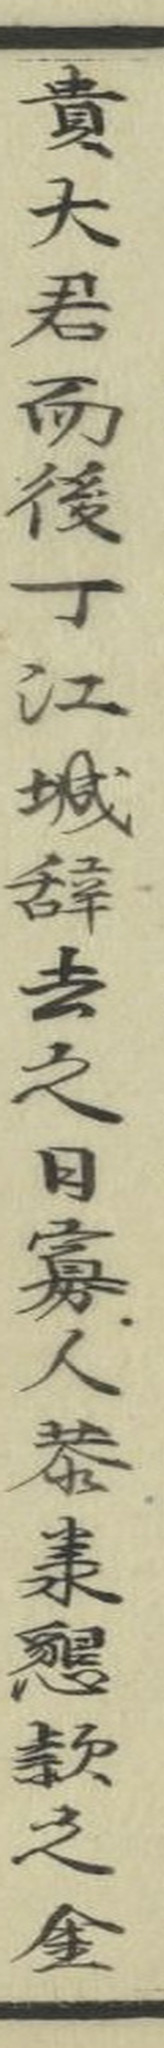貴大君而後丁江城辞去之日寡人恭承懇款之金
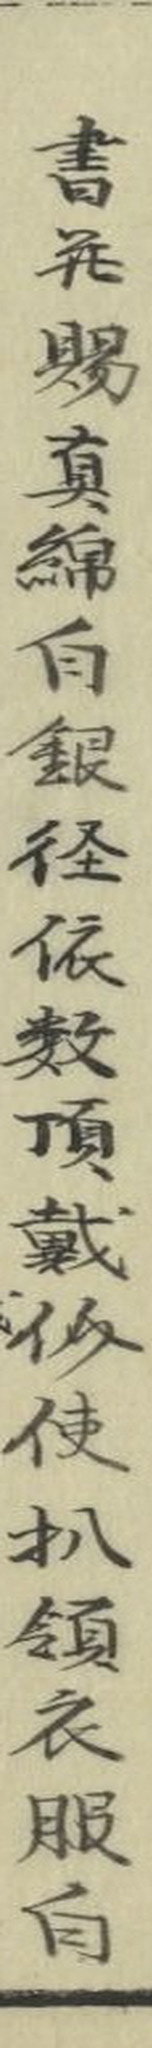書幷賜真綿白銀径依数頂戴价使扒領衣服白
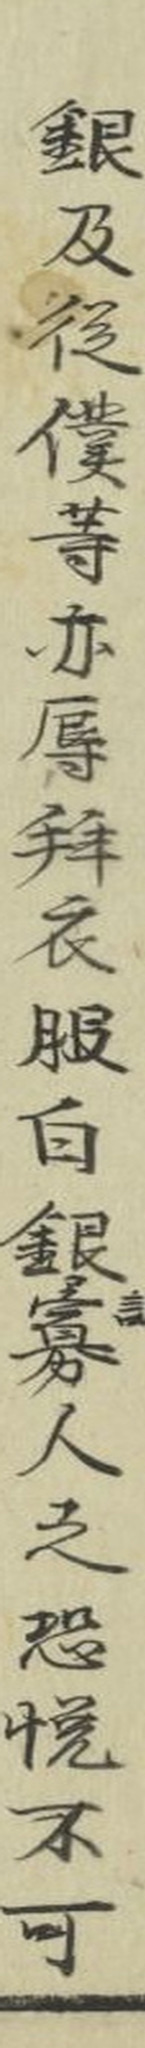銀及従僕等亦辱拝衣服白銀誠寡人之恐悦不可
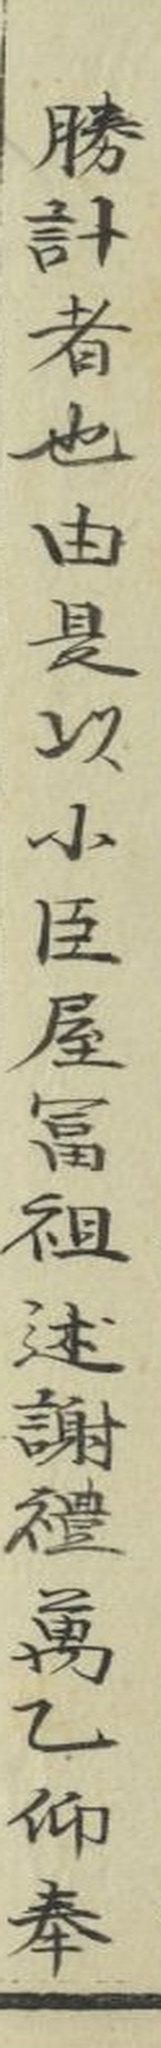勝計者也由是以小臣屋冨祖述謝礼萬乙仰奉
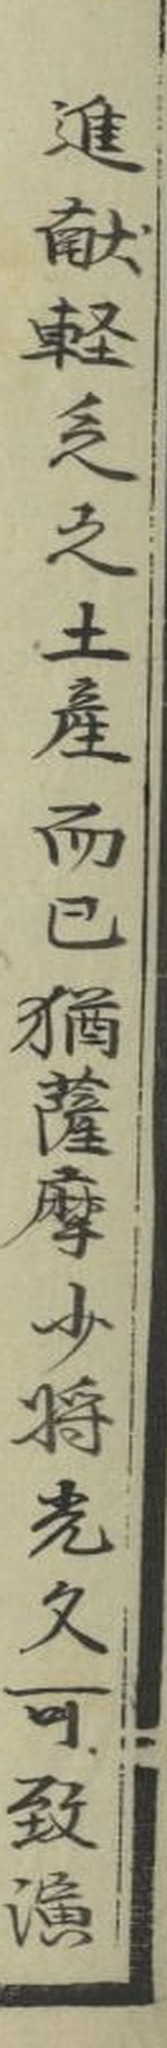進献軽乏之土産而己猶薩摩少将充久可致演
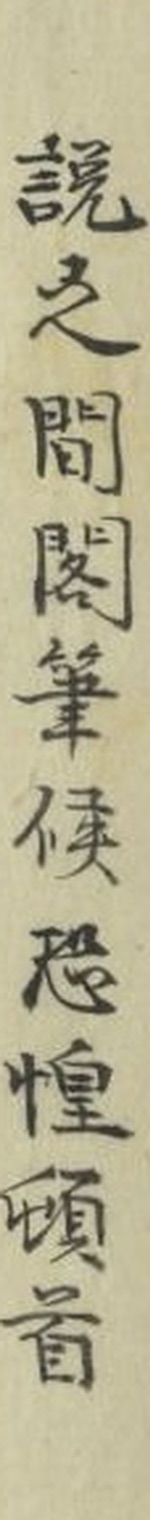説之間閣筆候恐惶頓首
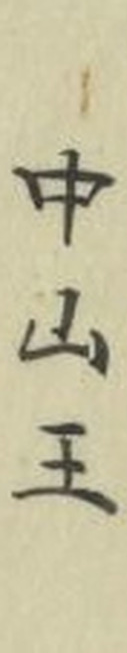中山王
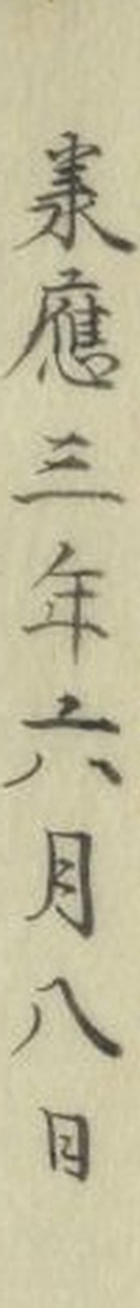承応三年六月八日尚質
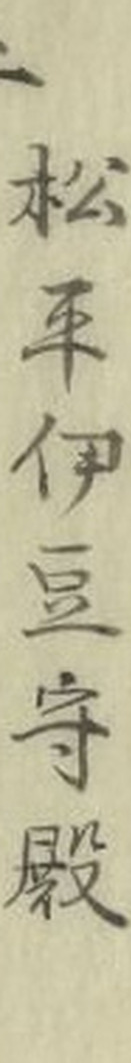松平伊豆守殿
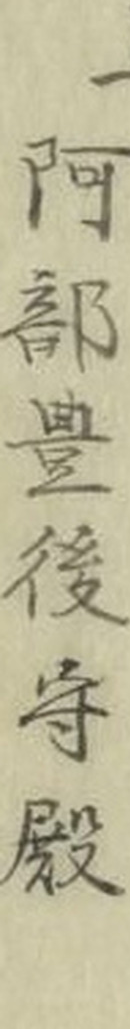阿部豊後守殿
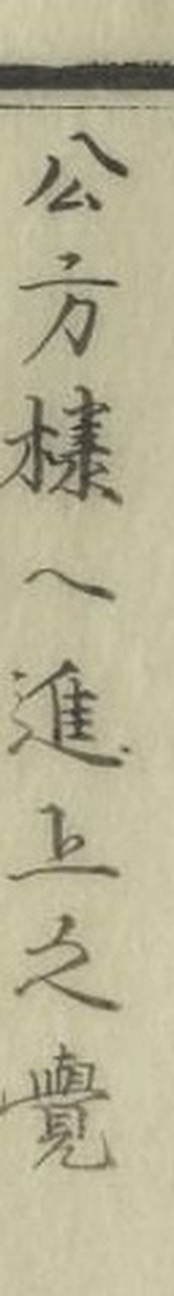公方様へ進上之覚

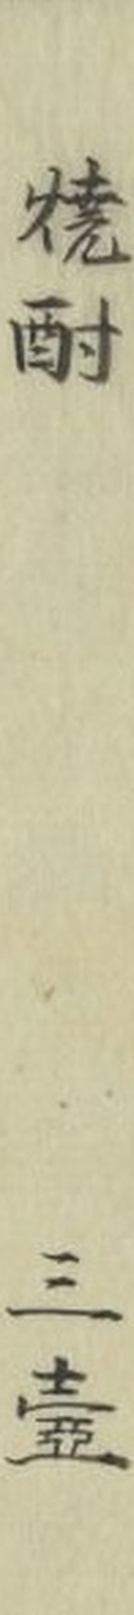焼酎三壺
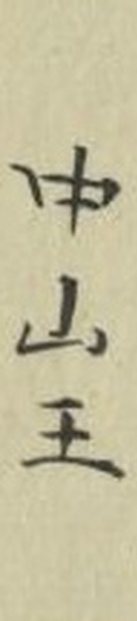中山王
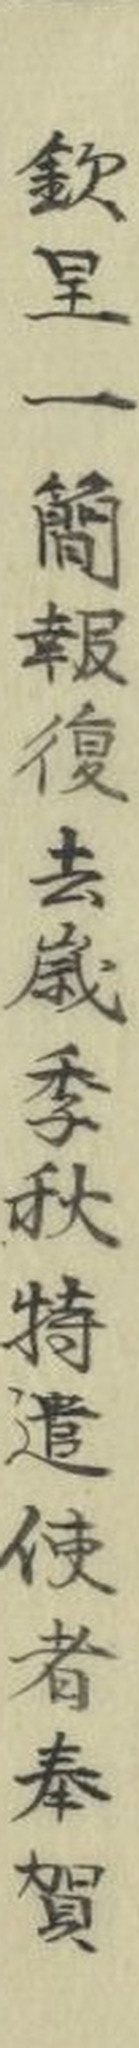欽呈一簡報復去歳季秋特遣使者奉賀
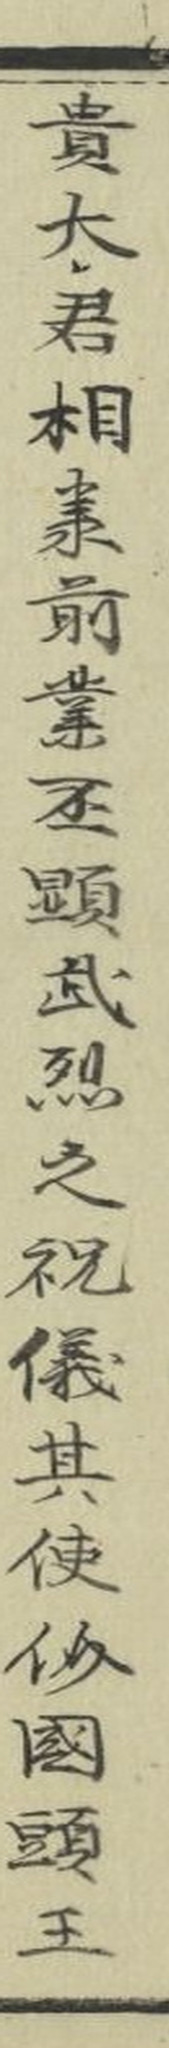貴大君相承前業丕顕武烈之祝儀其使价国頭王
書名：琉球往来（上）
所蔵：University of the Ryukyus Library
